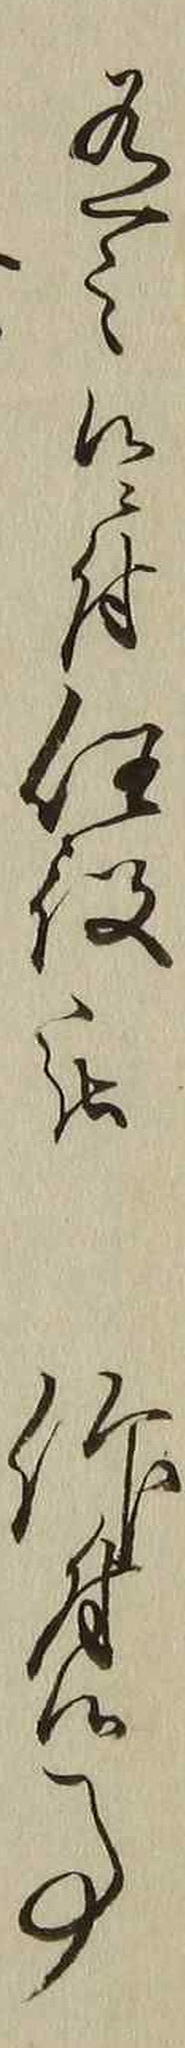有之候ニ付任役被仰付候事
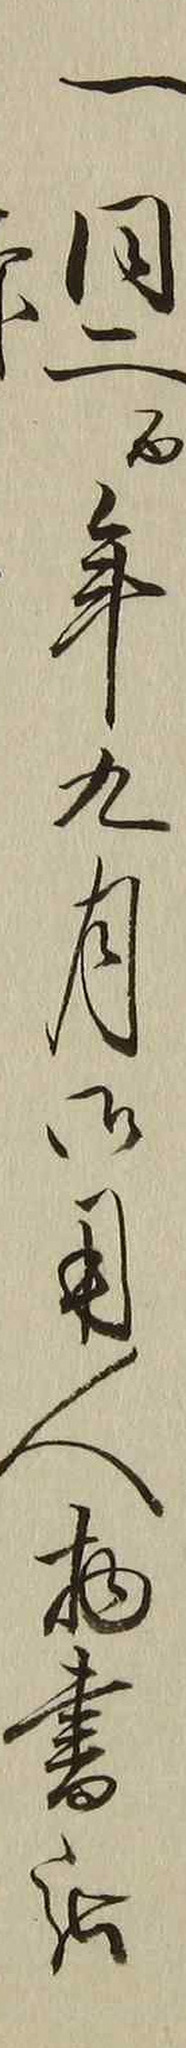一同二酉年九月御用人物書被
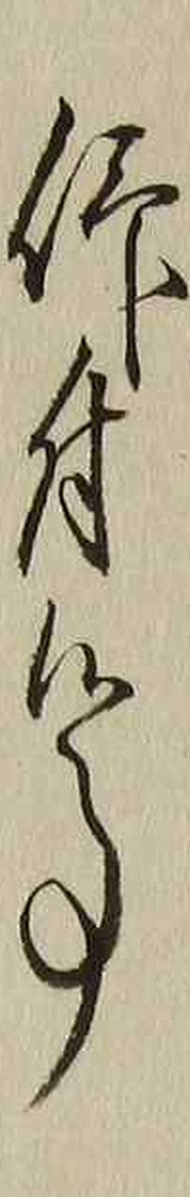仰付候事
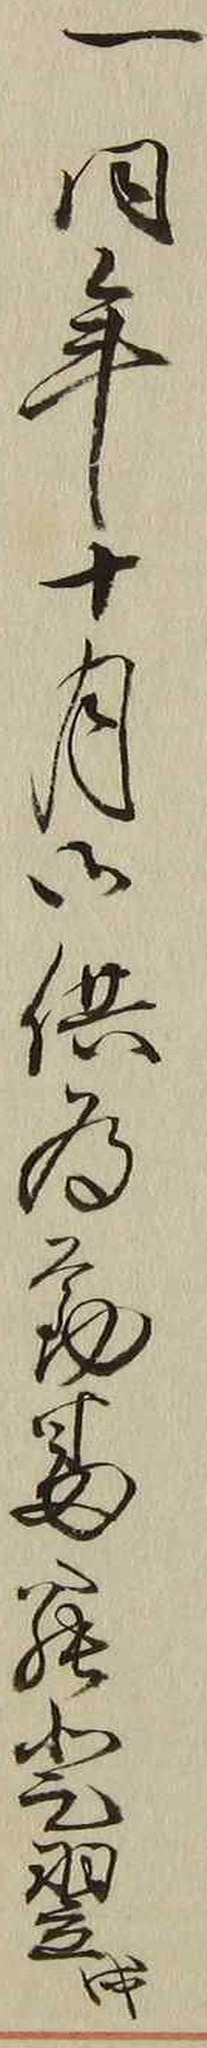一同年十月御供為勤番罷登翌戌
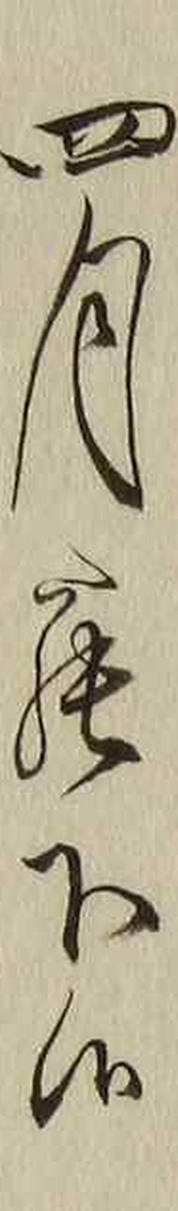四月罷下候
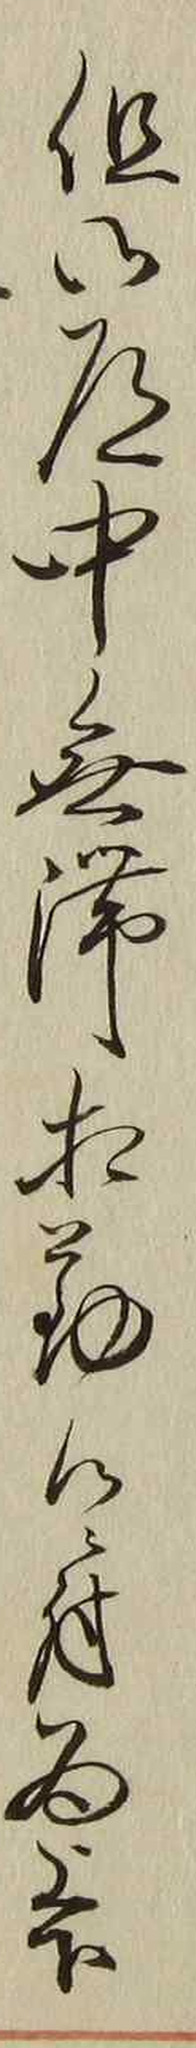但御道中無滞相勤候ニ付為上下
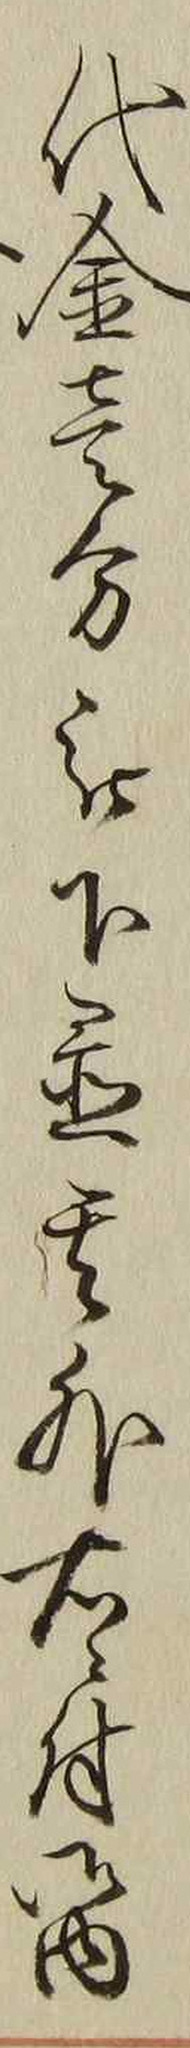代金壱分被下置其外右ニ付御内
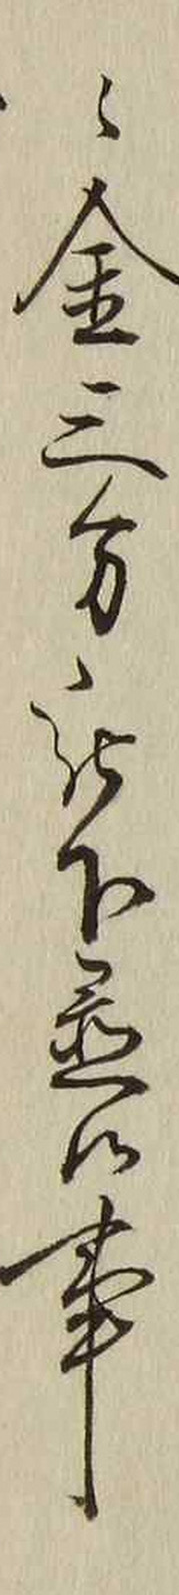々金三分被下置候事
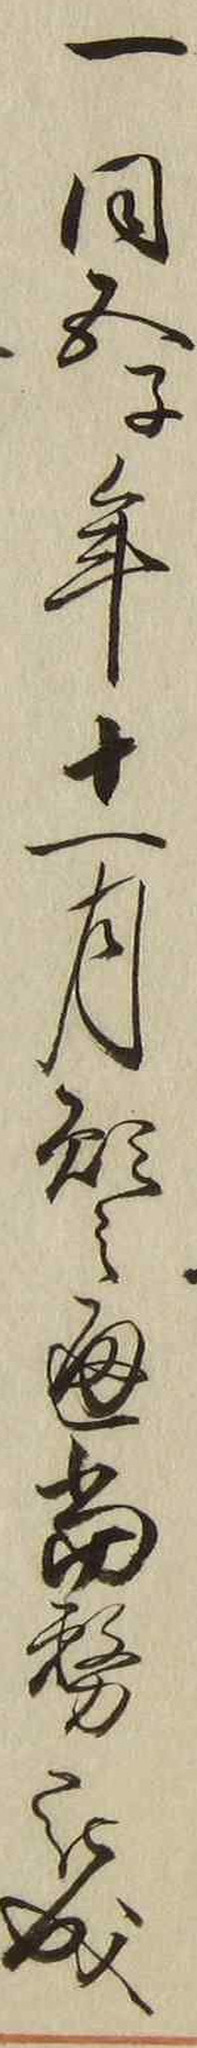一同五子年十一月願之通当務被成
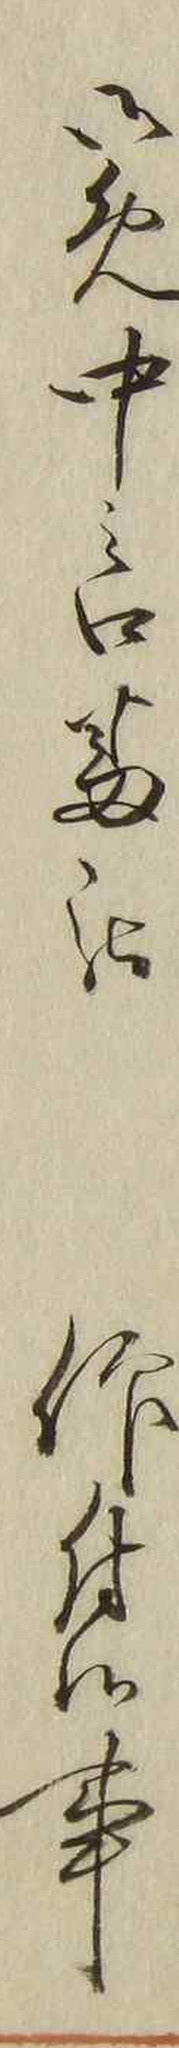御免中之口番被仰付候事
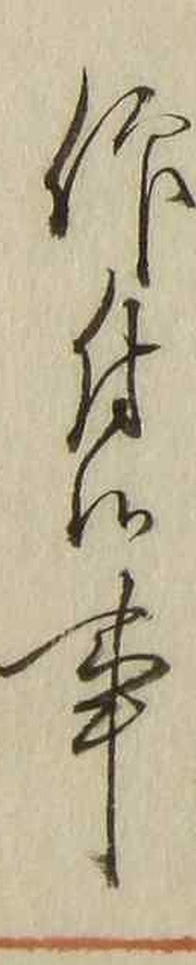仰付候事

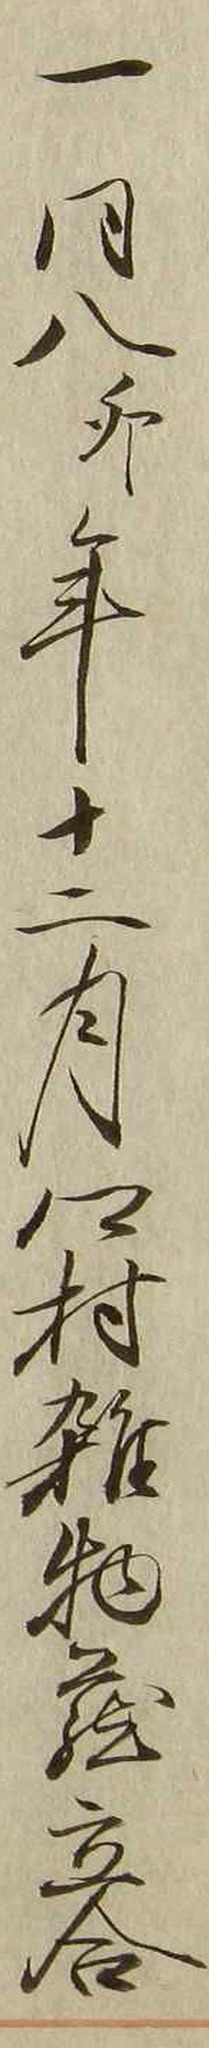一同八卯年十二月郷村雑物蔵立合
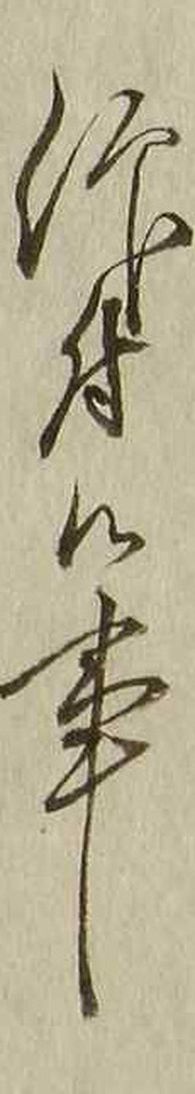仰付候事
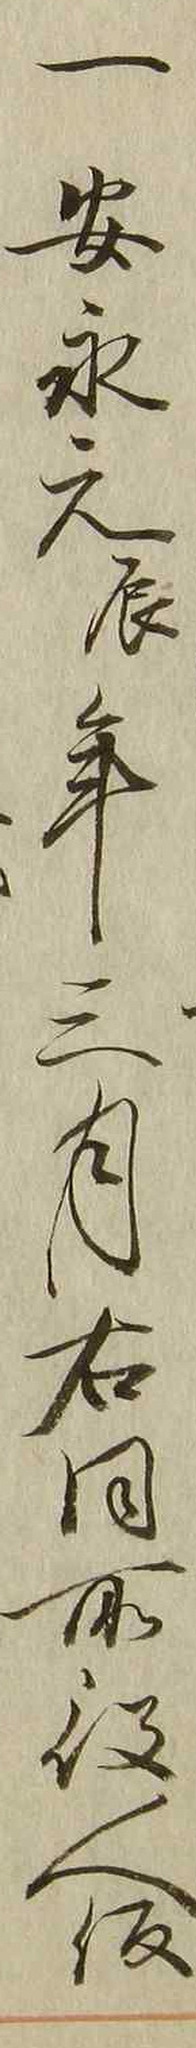一安永元辰年三月右同所役人仮
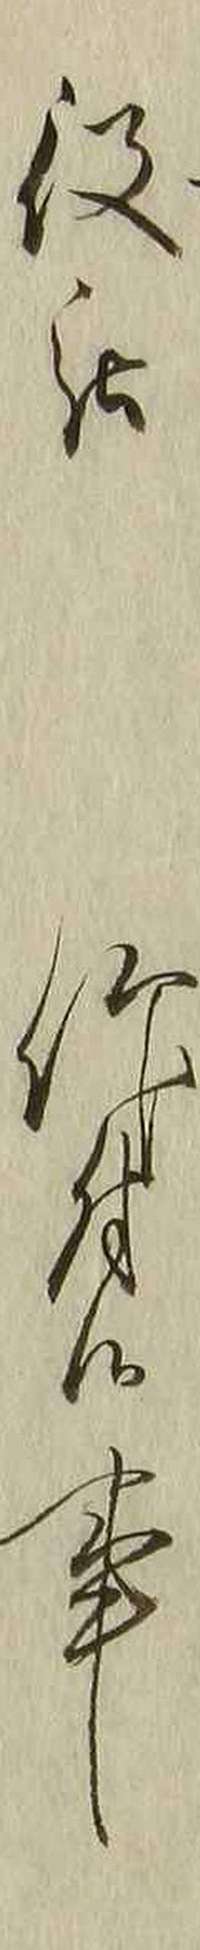役被仰付候事
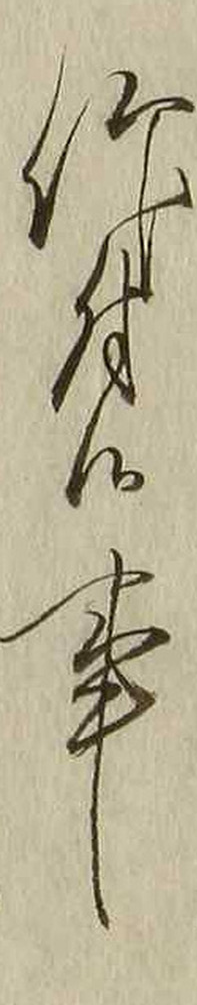仰付候事
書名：諸士系譜　巻之57　ほ之部4
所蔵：会津若松市立会津図書館
